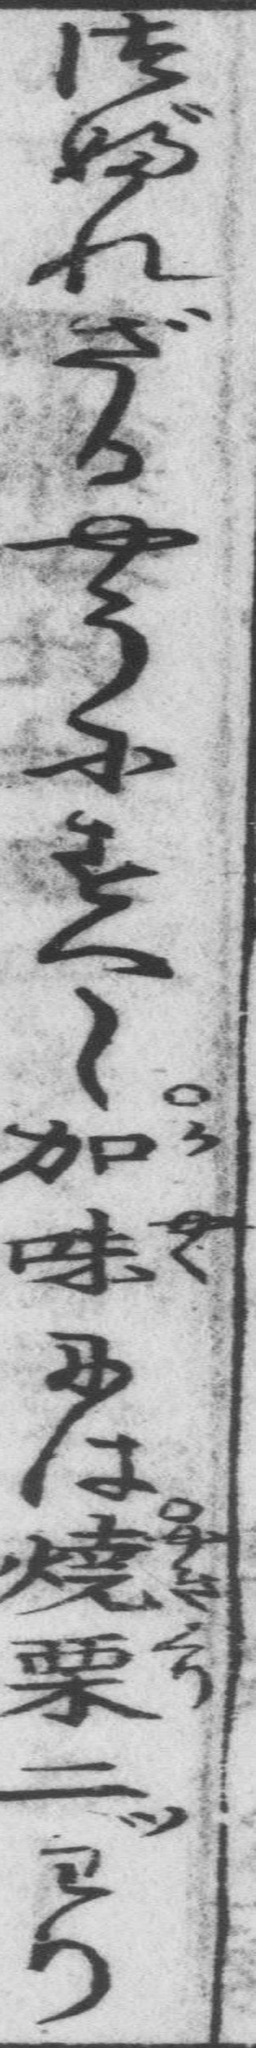つぶれざるやうにすへし。加味には。焼栗二ツわり
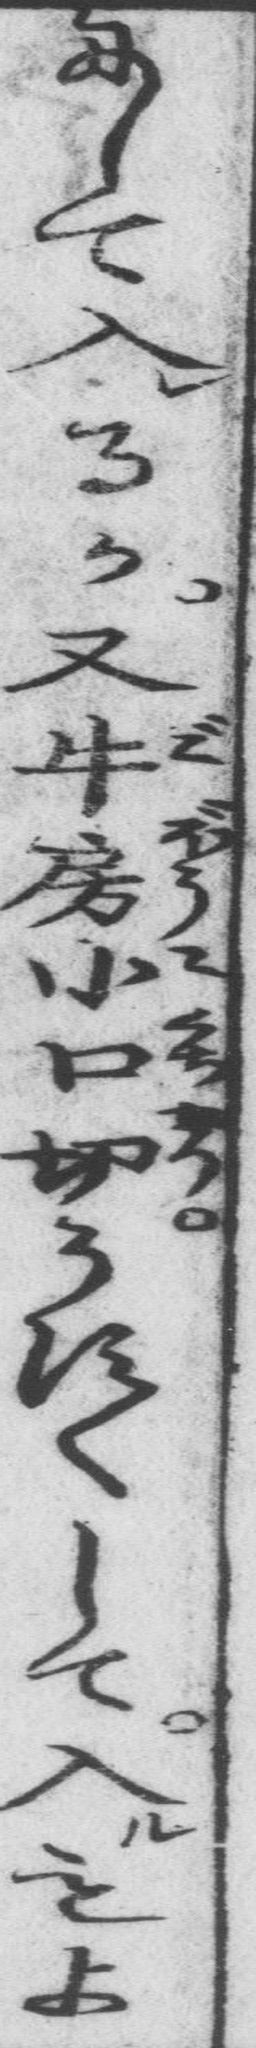にして入れるか。又牛房小口切。うすくして。入るもよ
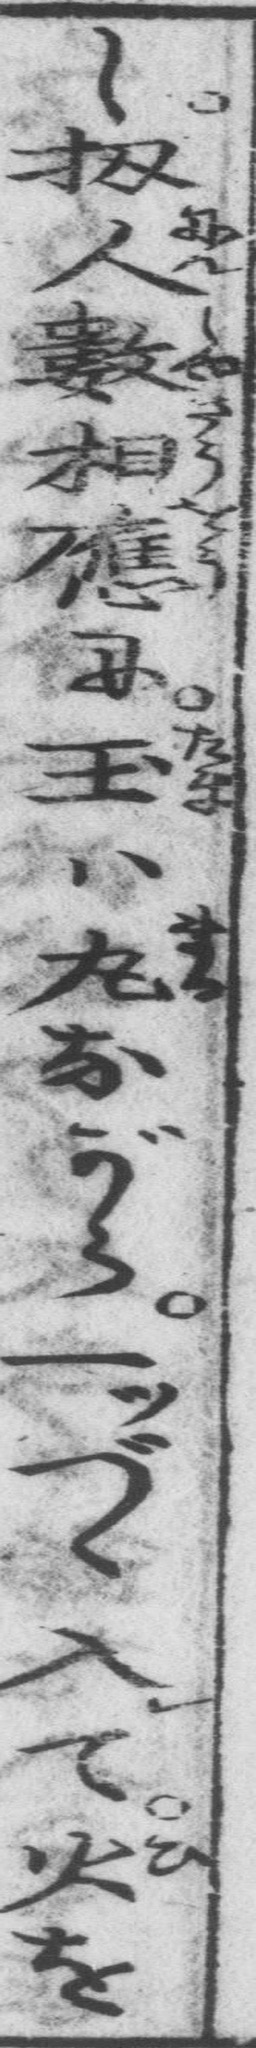し。扨人数相応に。玉は丸ながら。一ツづゝ入れて。火を
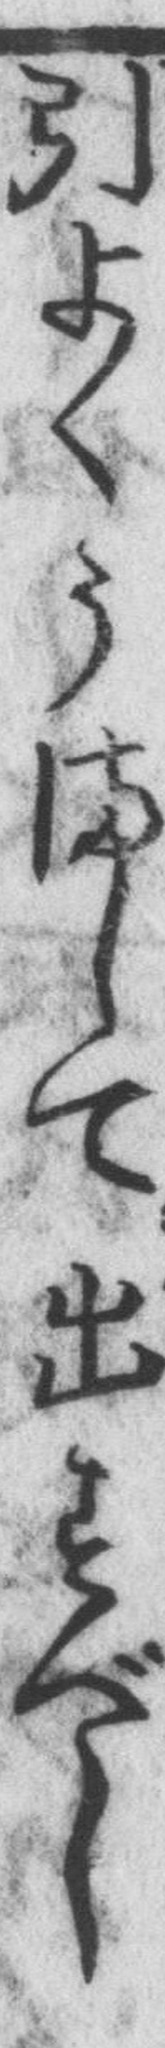引よく。うまして。出すべし
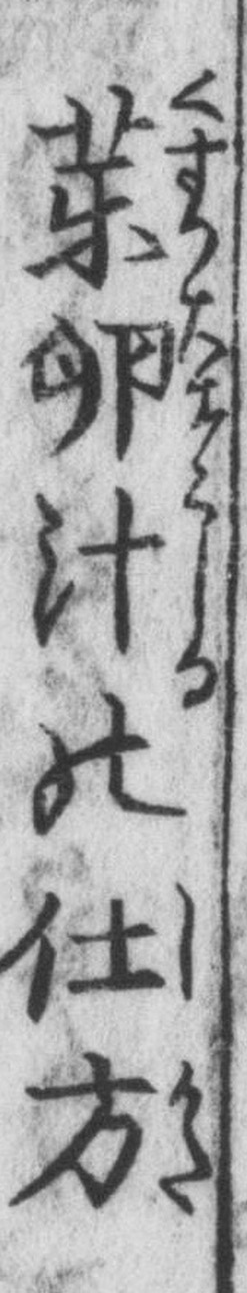薬卵汁の仕方
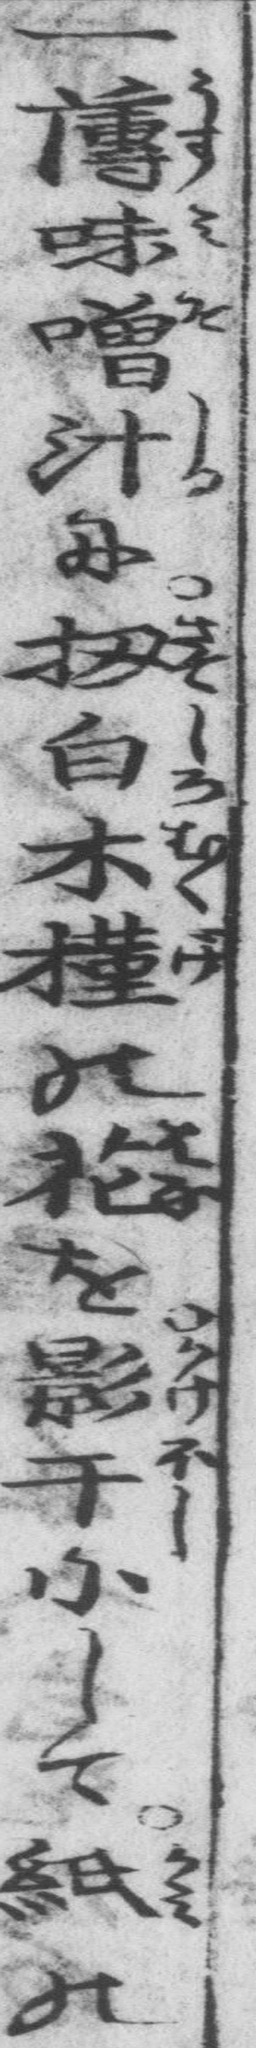一薄味噌汁に。扨白木槿の花を。影干にして。紙の

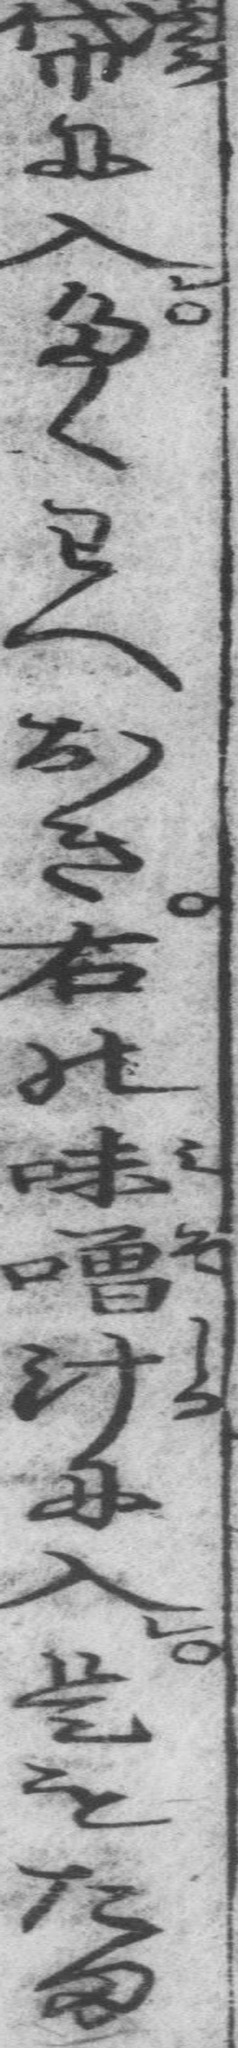袋に入れ。たくわへおき。右の味噌汁に入れ。是もたま
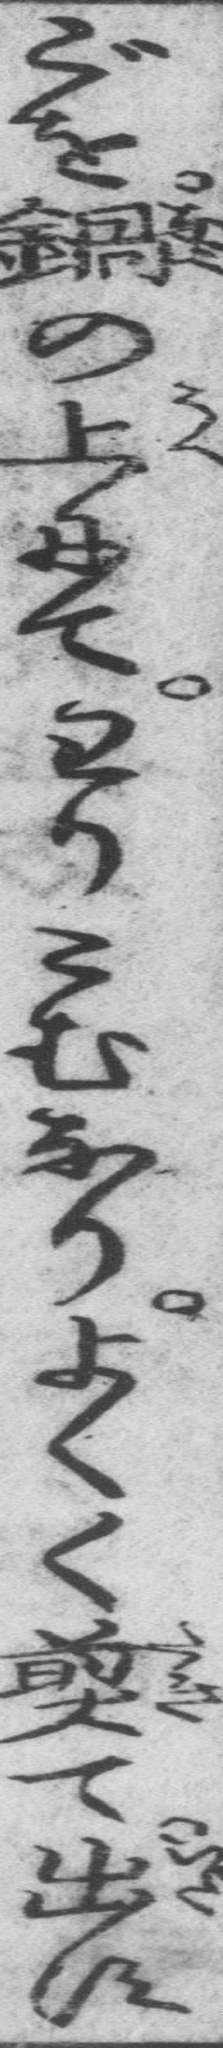ごを。鍋の上にて。わりこむなり。よく〳〵煎て。出す
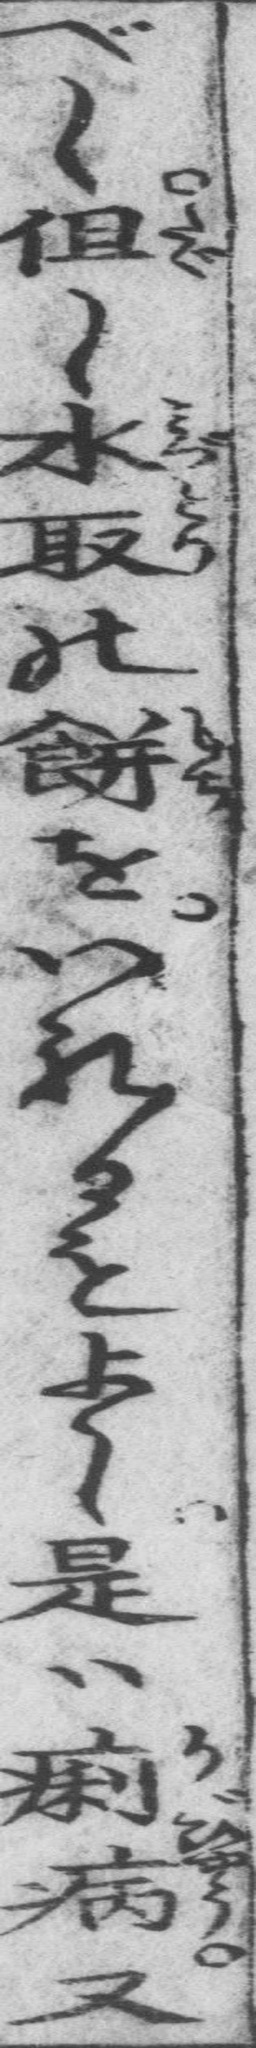べし。但し水取の餅を。いれるもよし。是は痢病。又
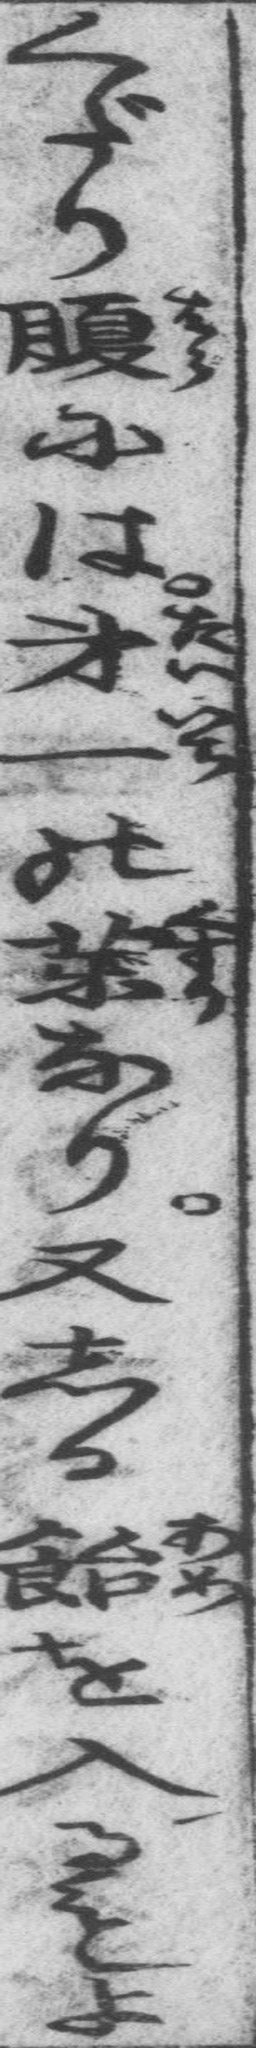くだり腹には。第一の薬なり。又しる飴を入れるもよ
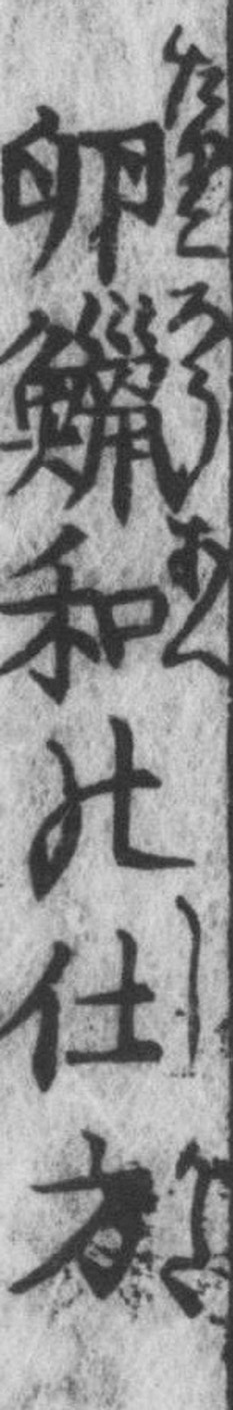卵鱲和の仕方
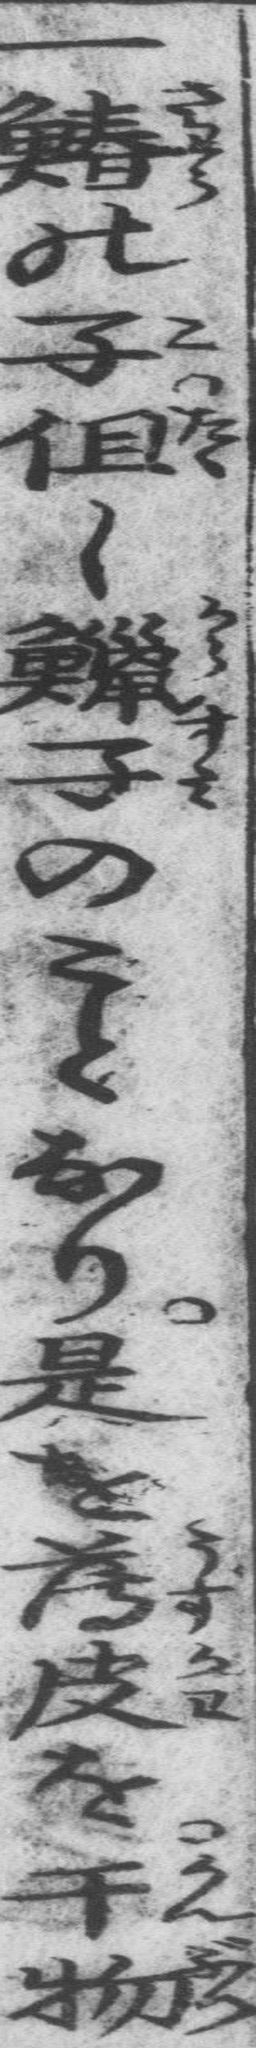一鰆の子。但し鱲子のことなり。是を薄皮を。干物
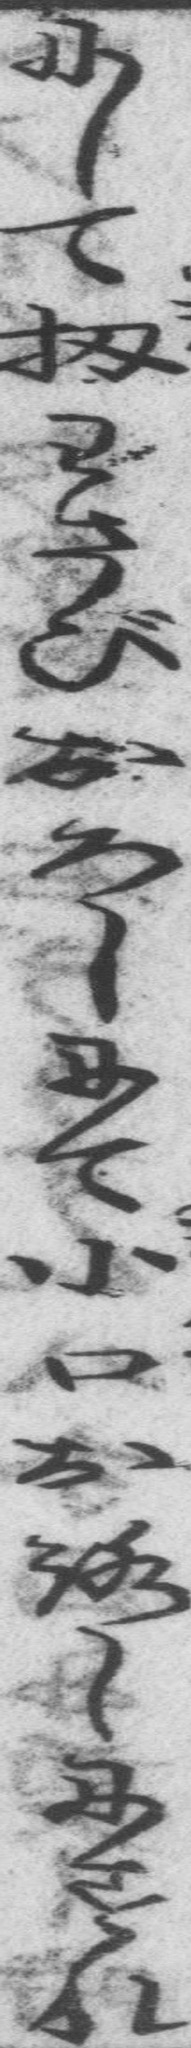にして。扨わさびおろしにて。小口おろしにすれ
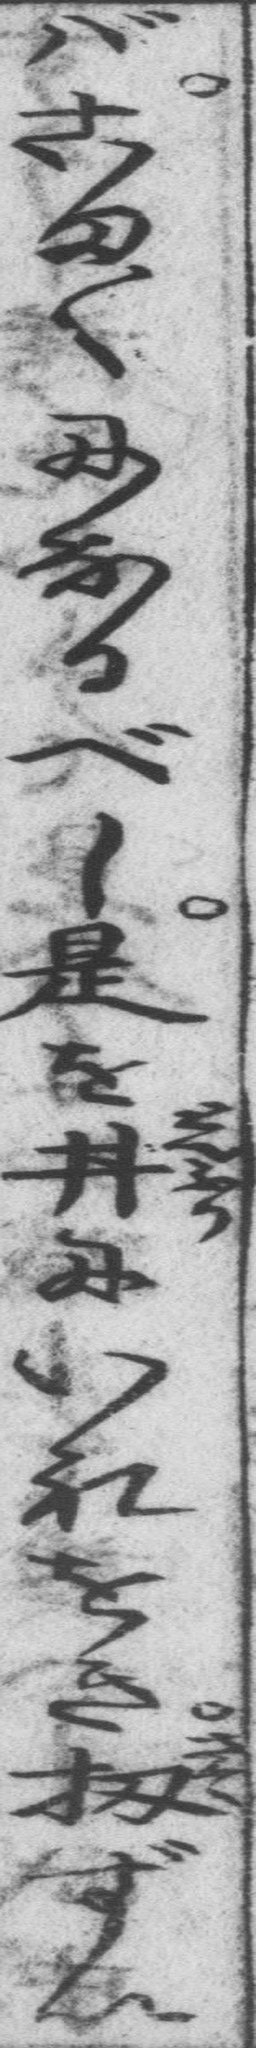ば。こま〳〵になるべし。是を丼にいれをき。扨ずい
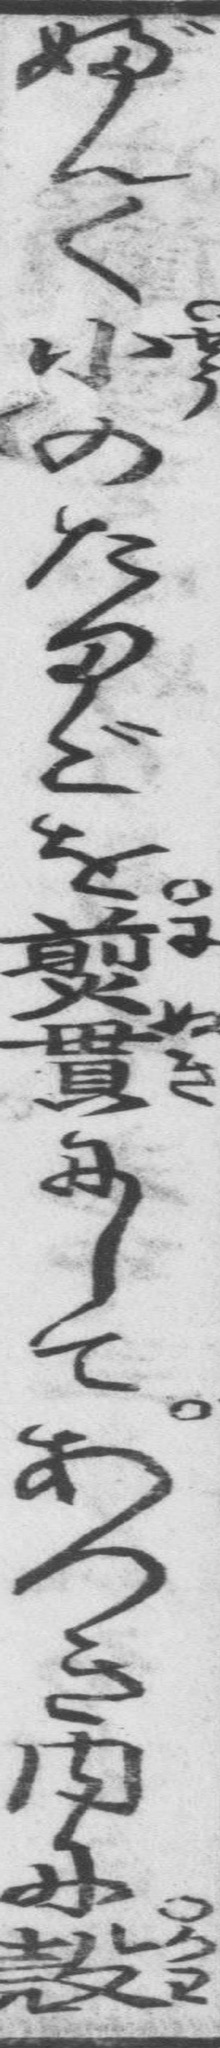ぶん〳〵。小のたまごを。煎貫にして。あつき内に。殻
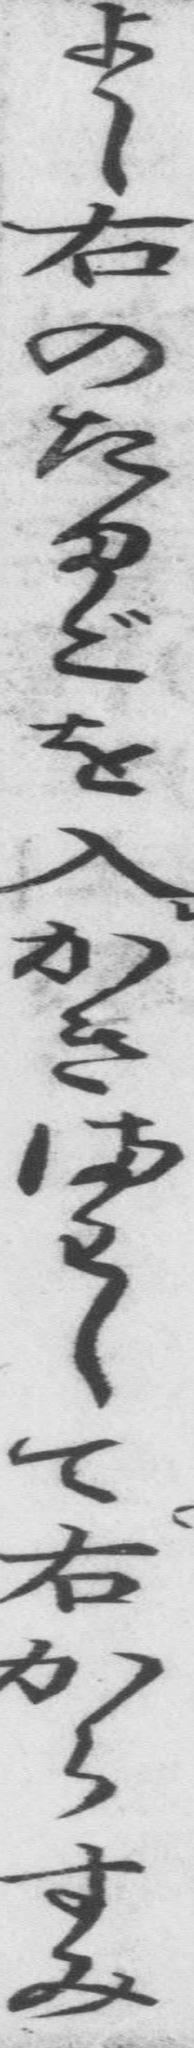よし。右のたまごを入れ。かきまわして。右からすみ
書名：萬寳料理秘密箱
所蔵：大阪府立大学学術情報センター 国文学研究資料館
